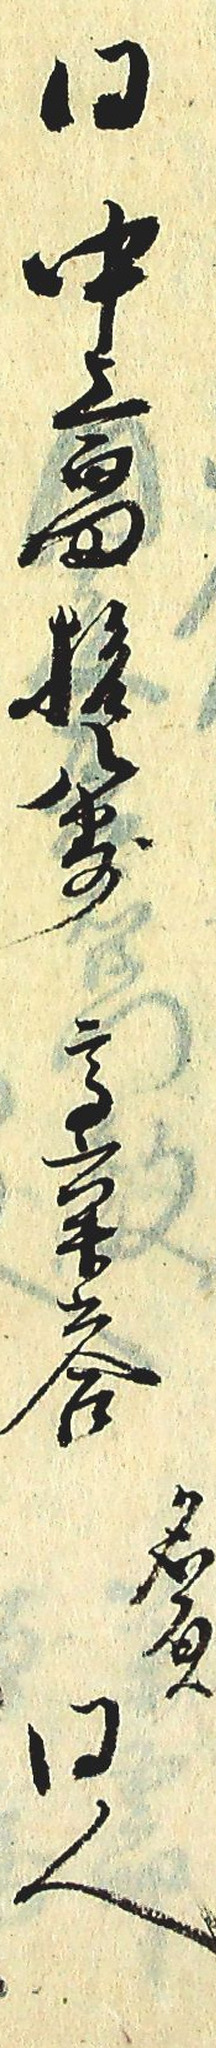同中上畠拾八歩高六升六合同人
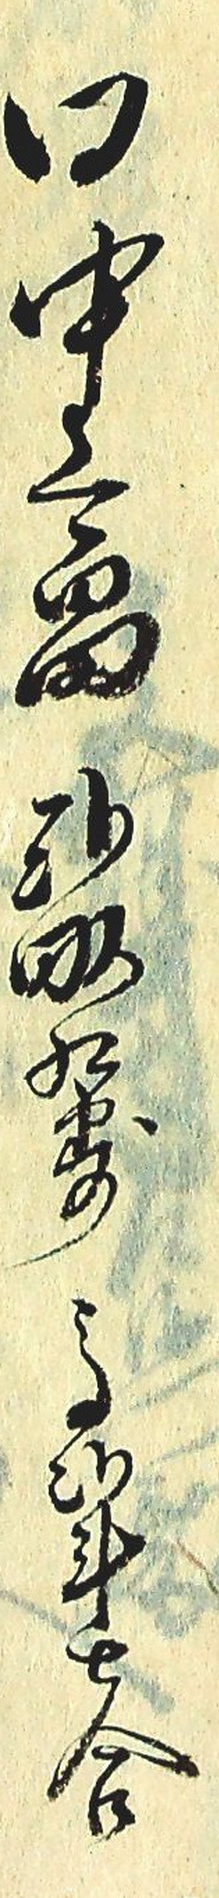同中上畠弐畝九歩高弐斗七合同人
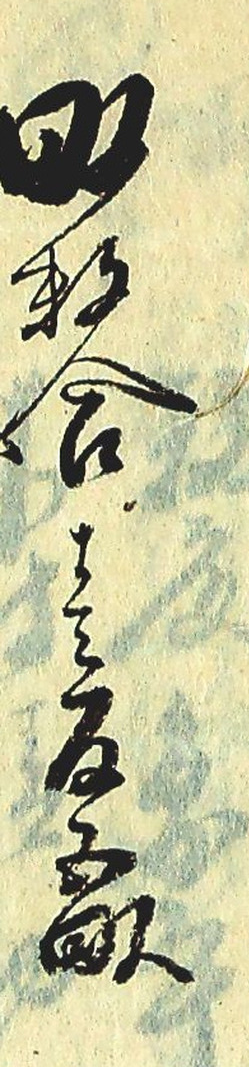畝数合壱反五畝
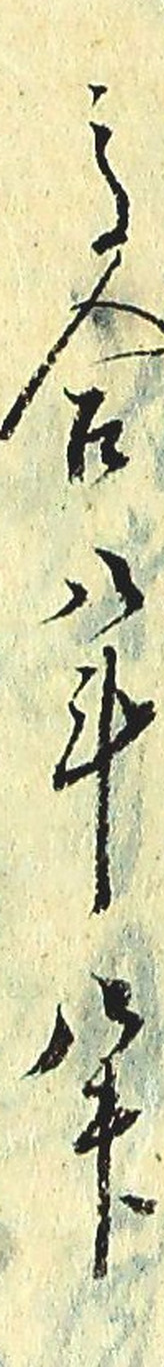高合八斗八升
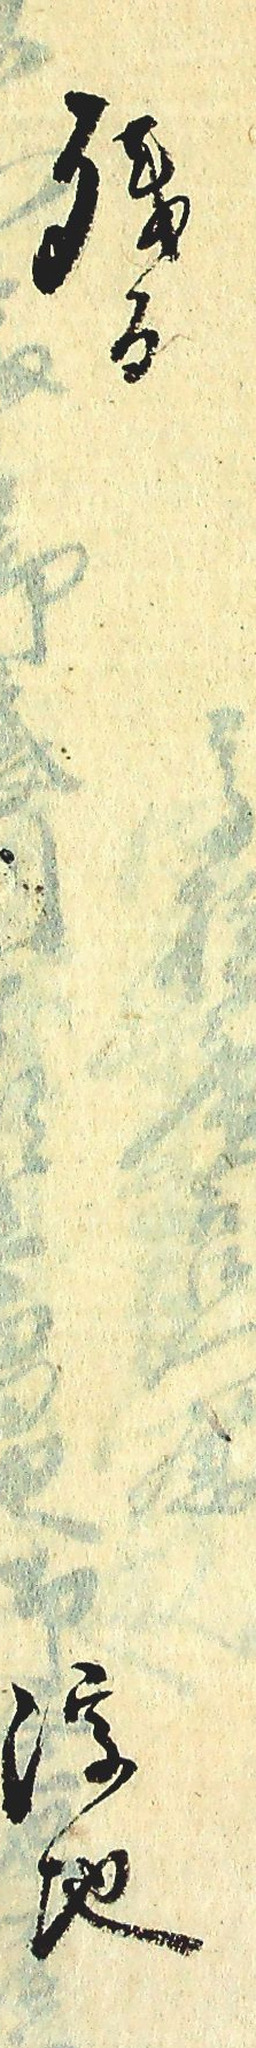残て浮地
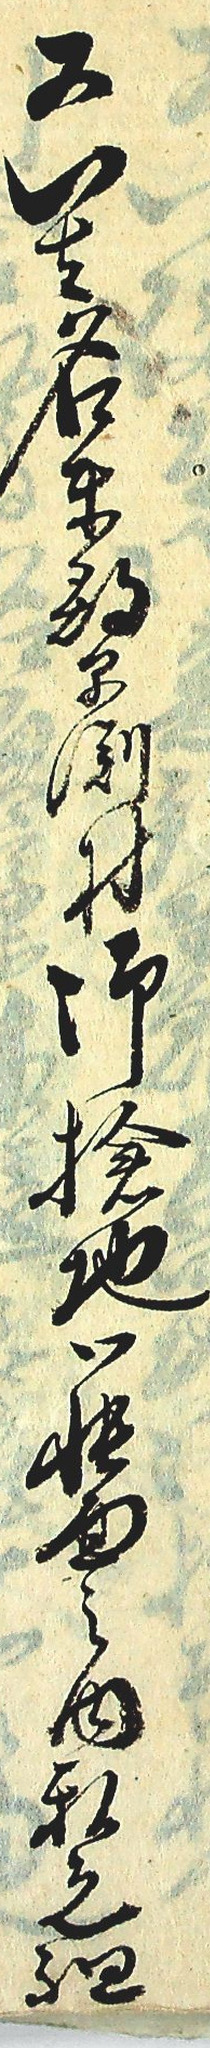右は名東郡早淵村御検地御帳面之内私先祖
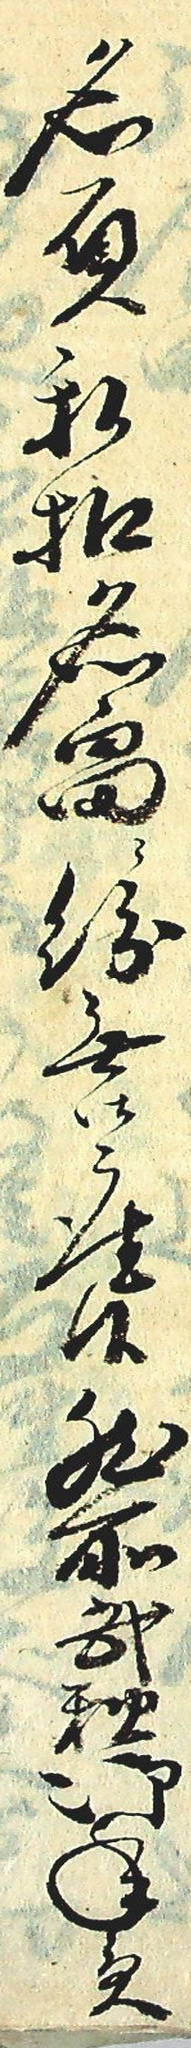名負私扣名畠に紛無御座候然所当秋御年貢
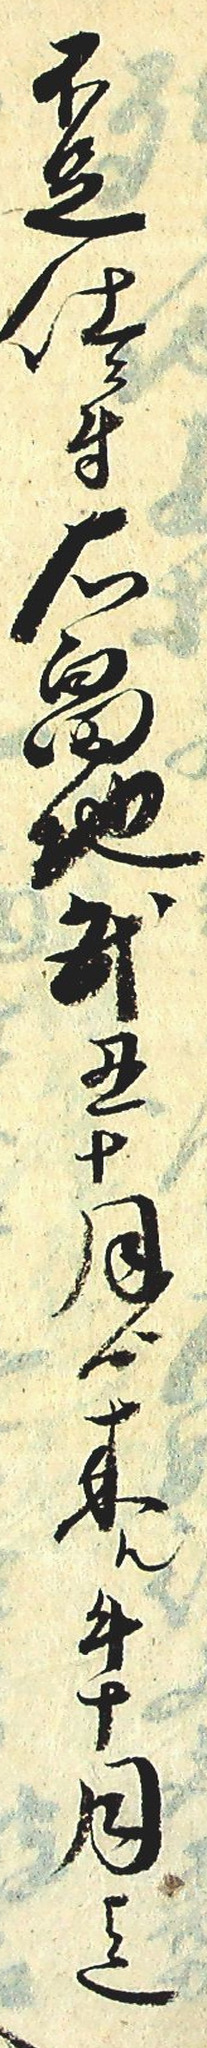不足仕に付右畠地当丑十月ゟ来る午十月迄
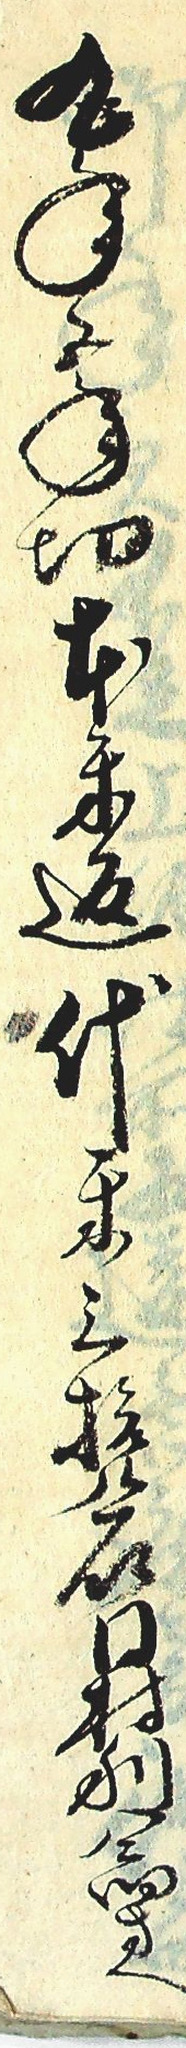丸年五年切本米返代米三拾八石同村利八郎方へ

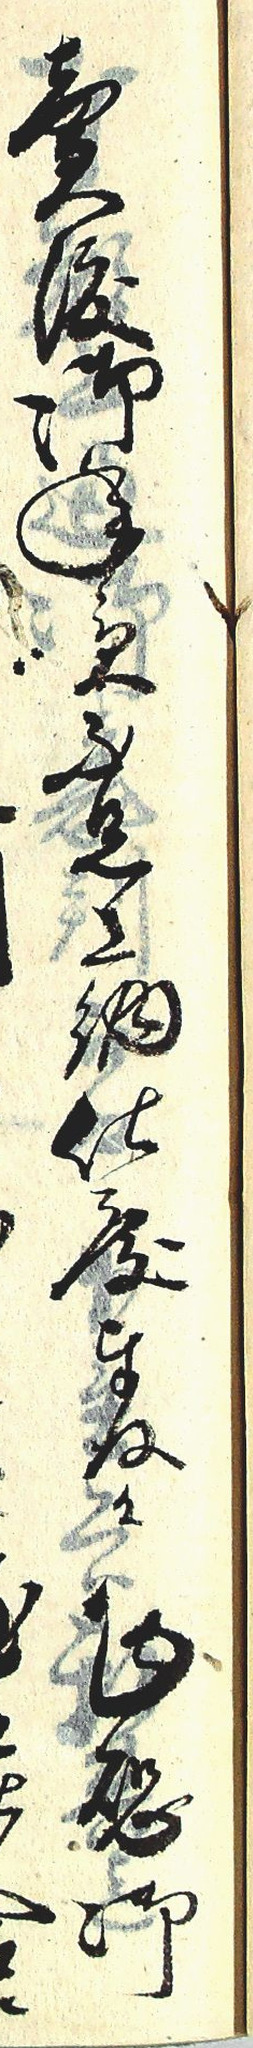売渡御年貢不足上納仕度奉存候乍恐御
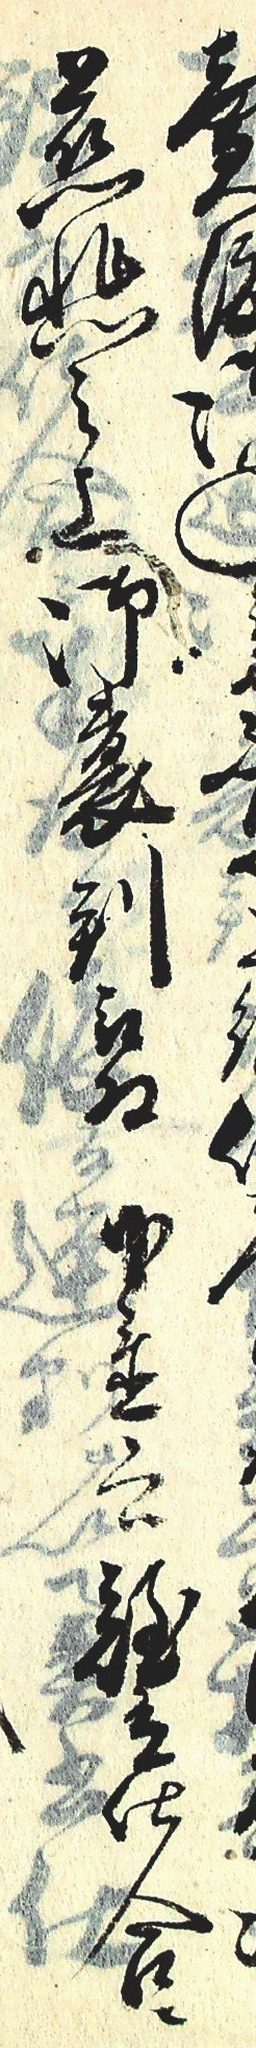慈悲之上御裏判被為下置候へは難有仕合に
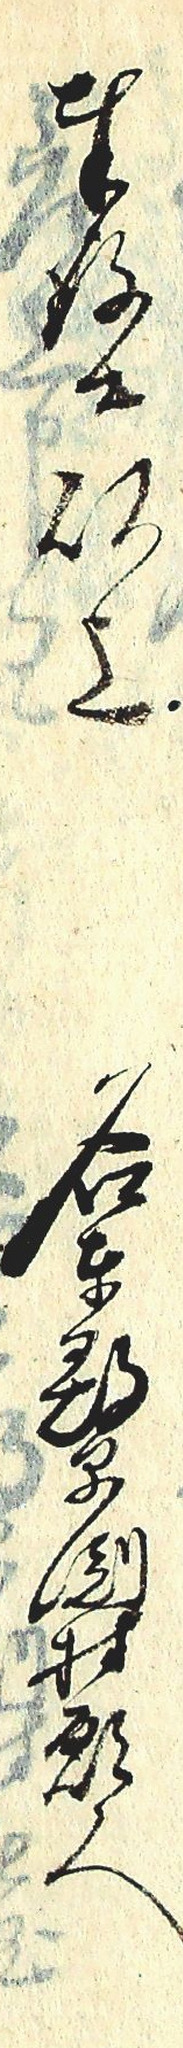奉存候以上名東郡早淵村願人
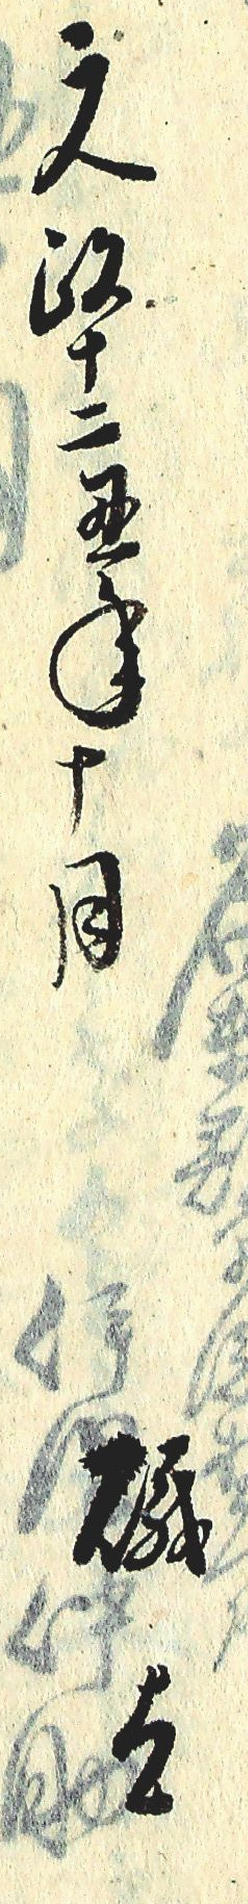文政十二丑年十月磯太
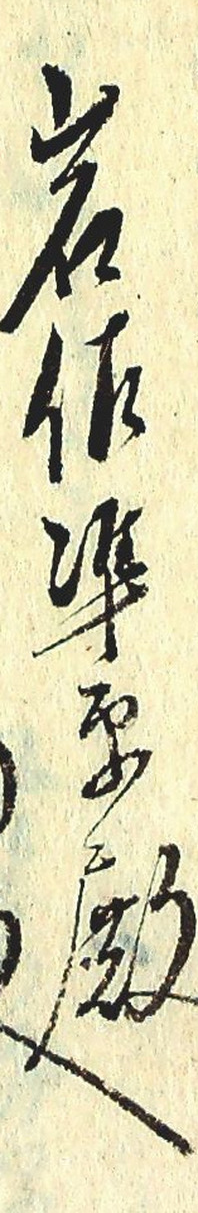岩佐準平殿
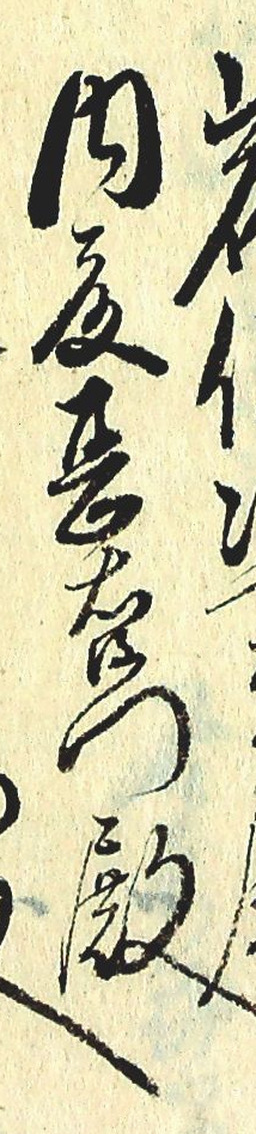内藤甚右衛門殿
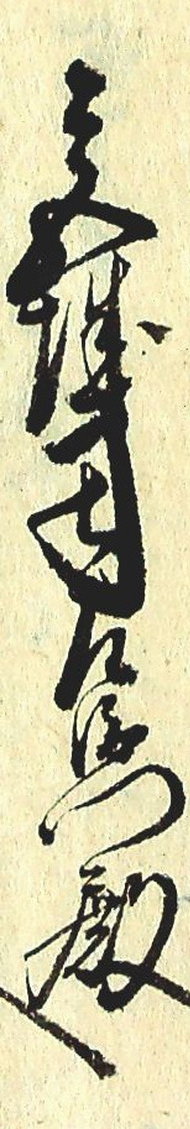宮城周左衛門殿
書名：諸御願書控(弐番）
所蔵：鳴門教育大学 Naruto University of Education
